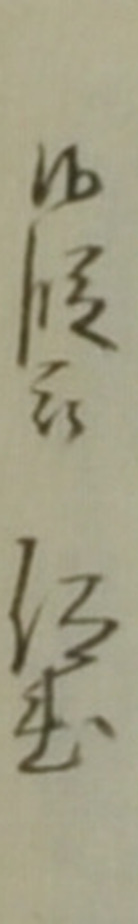候段被仰出
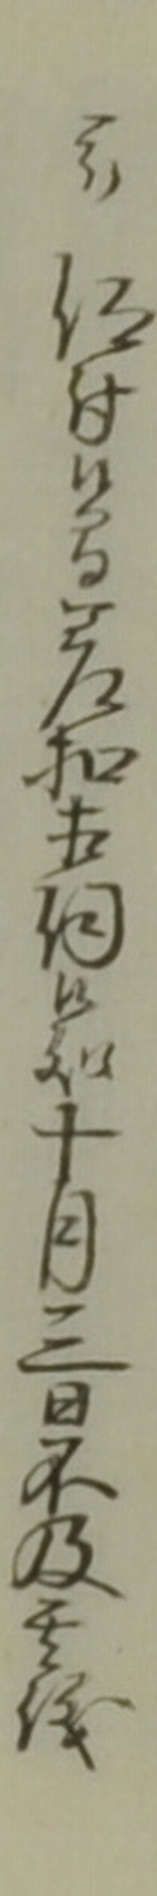被仰付候間差控相伺候処十月三日不及其儀
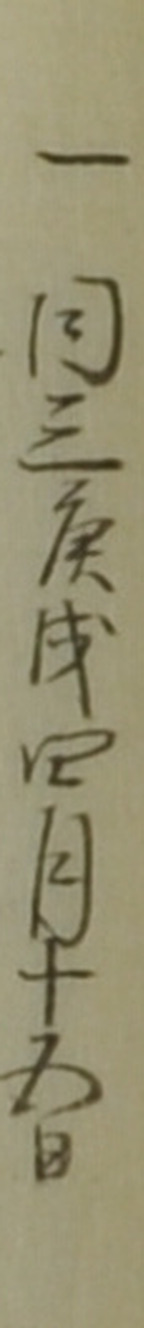一同三庚戌四月十五日
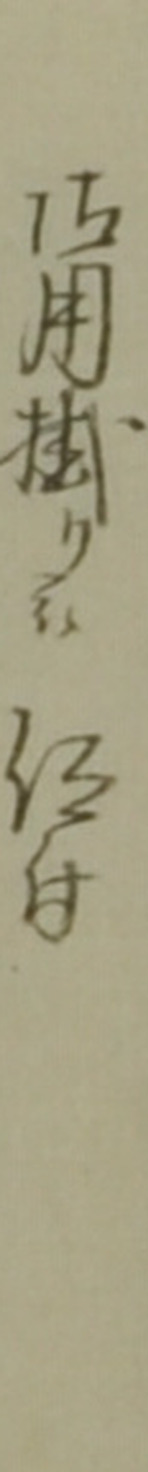御用掛リ被仰付
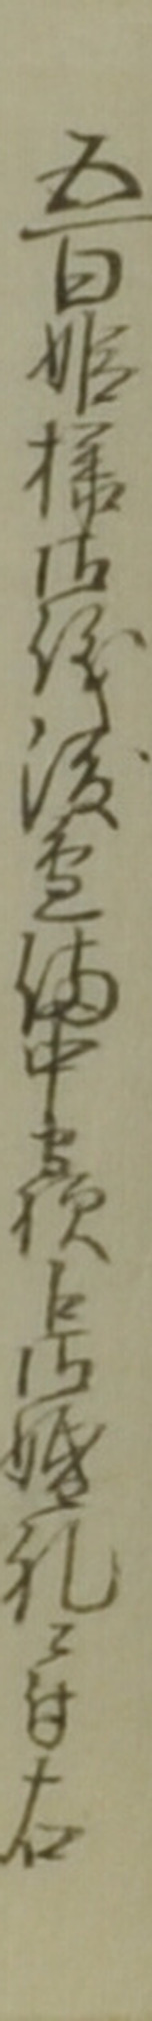五百姫様御儀渡辺備中守様江御婚礼ニ付右
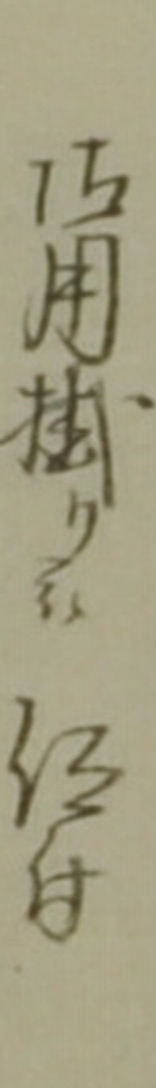御用掛リ被仰付
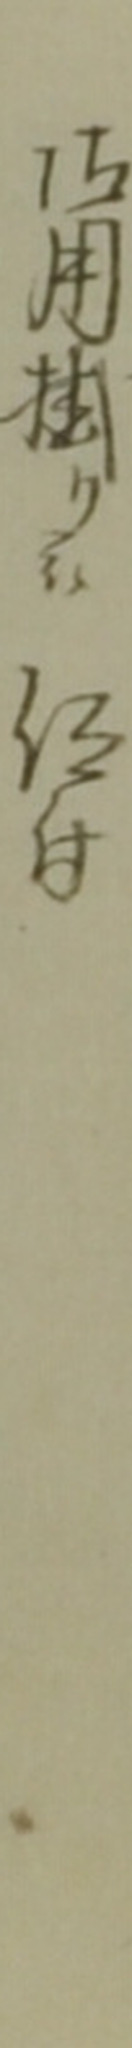御用掛リ被仰付
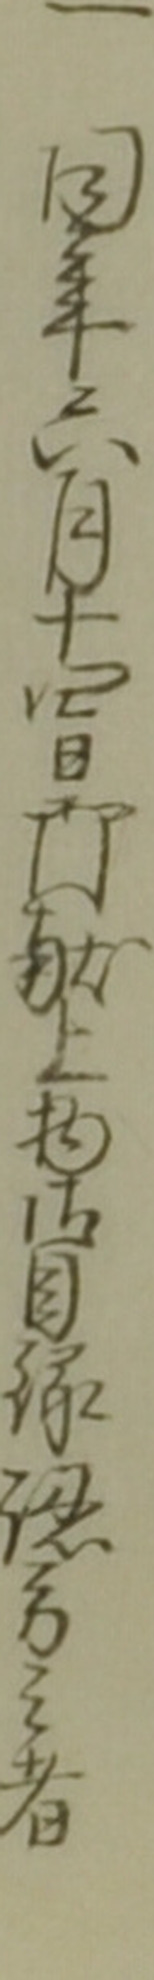一同年六月十四日御献上物御目録認方之者
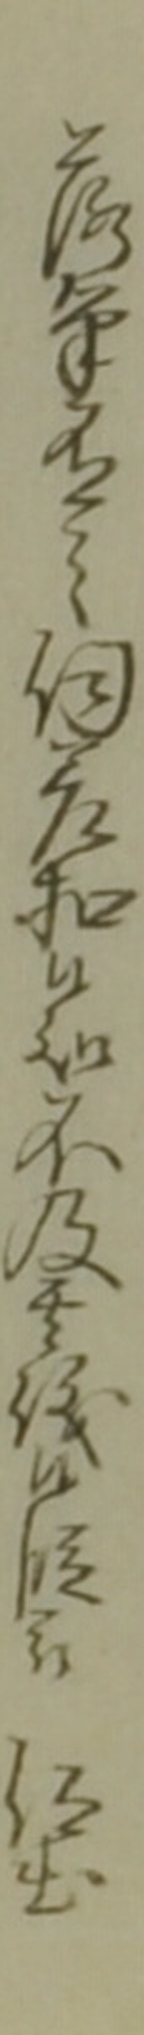落筆有之伺差控候処不及其儀候段被仰出
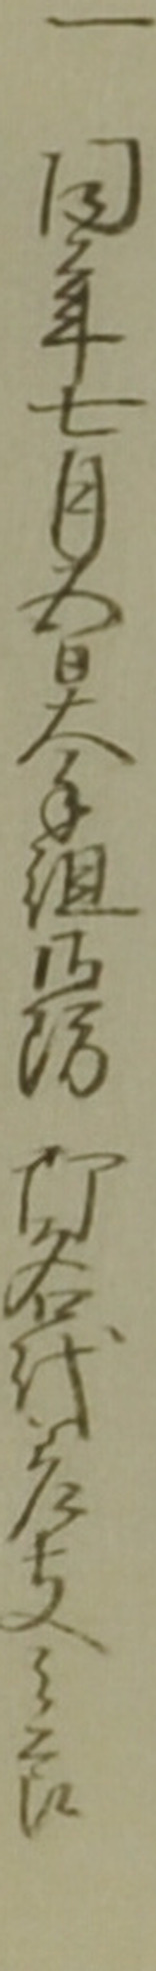一同年七月五日大手組御防御名代差支之節
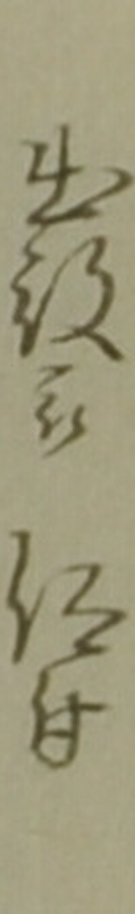出役被仰付
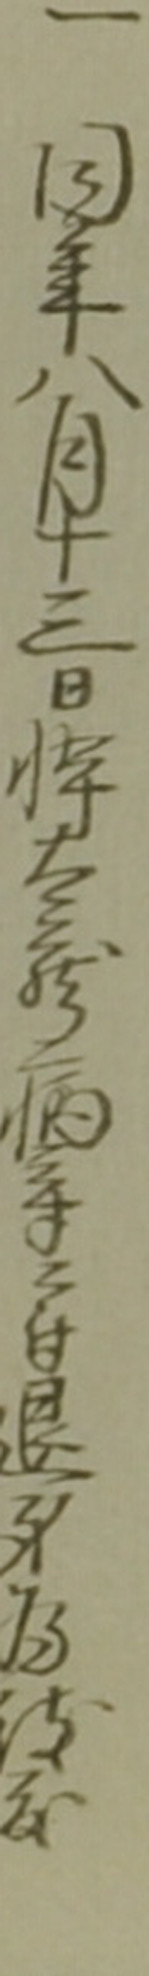一同年八月十三日忰太蔵病気ニ付退身為致度
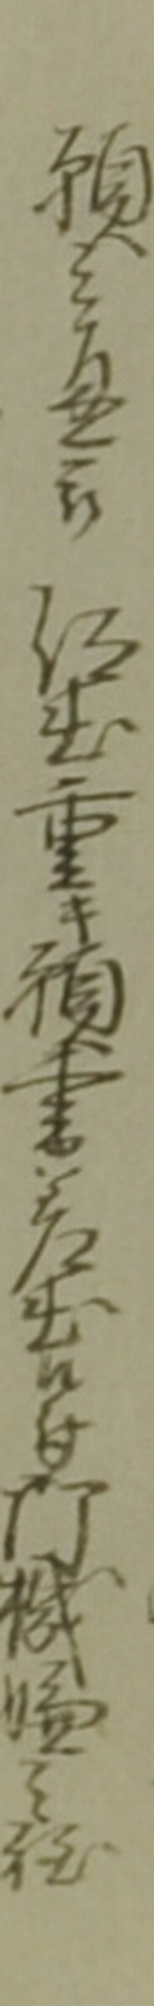願之通被仰出重キ願書差出候付御機嫌之程
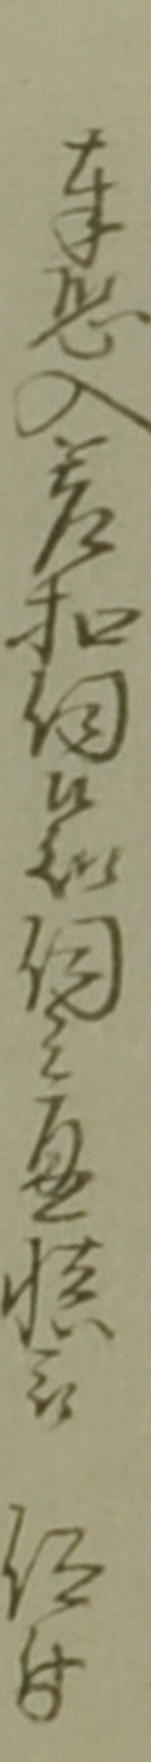奉恐入差控伺候処伺之通慎被仰付
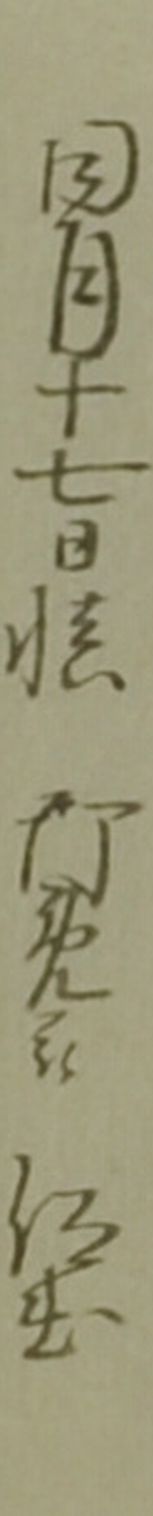同月十七日慎御免被仰出
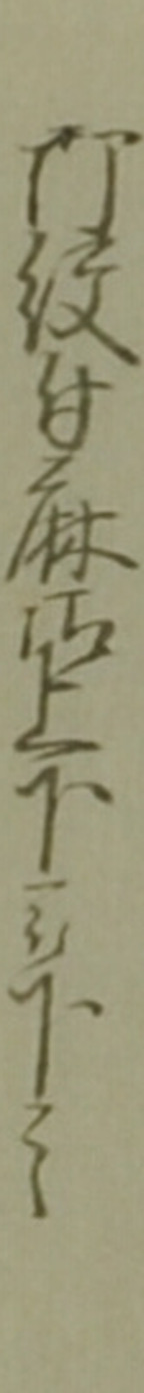御紋付麻御上下被下之
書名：給人諸士勤仕録（三）
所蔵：伊那市立高遠町図書館・合同会社AMANE
